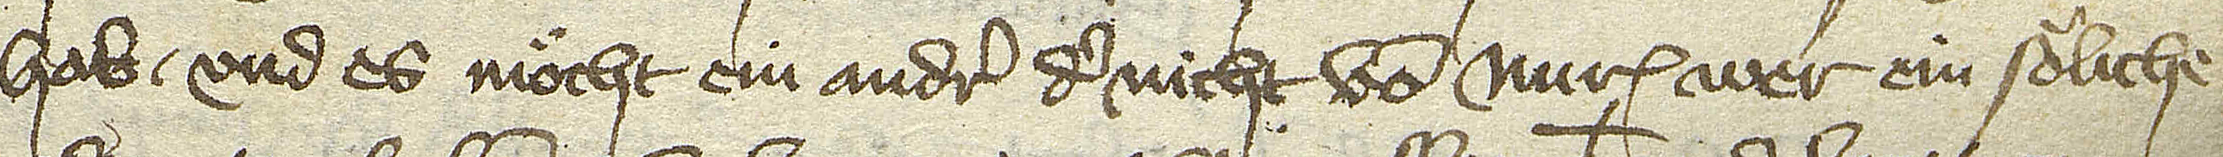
hab / vnd es möcht ein andr* d* nicht vo* Nur* wer ein ſöliche
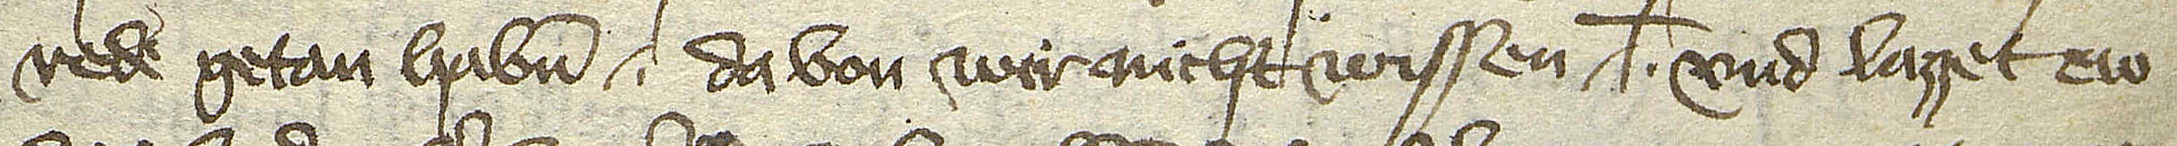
rede getan habn* / . da von wir nicht wiſſen / . vnd laʒʒet ew
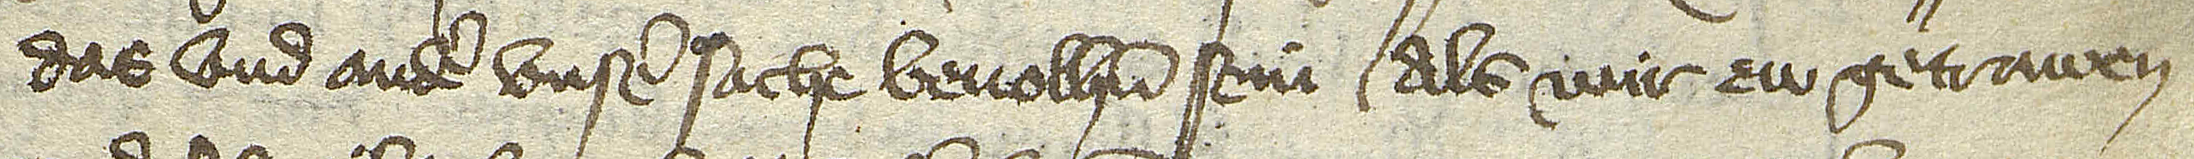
das vnd and* vnſe* ſache beuolhn* ſein / als wir ew getrawen
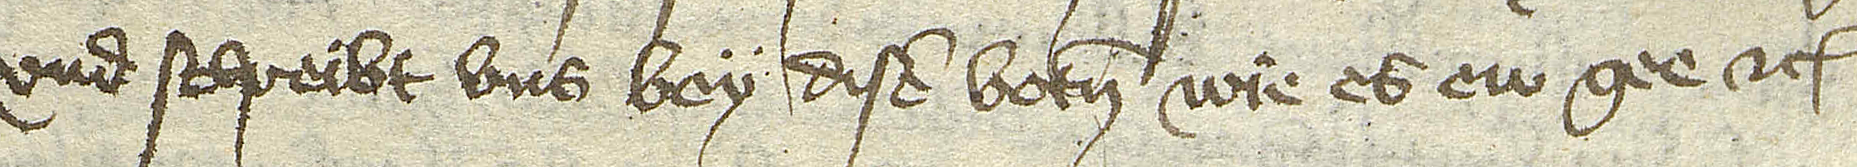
vnd ſchreibt vns bey diſe* botn* wie es ew gee ec*
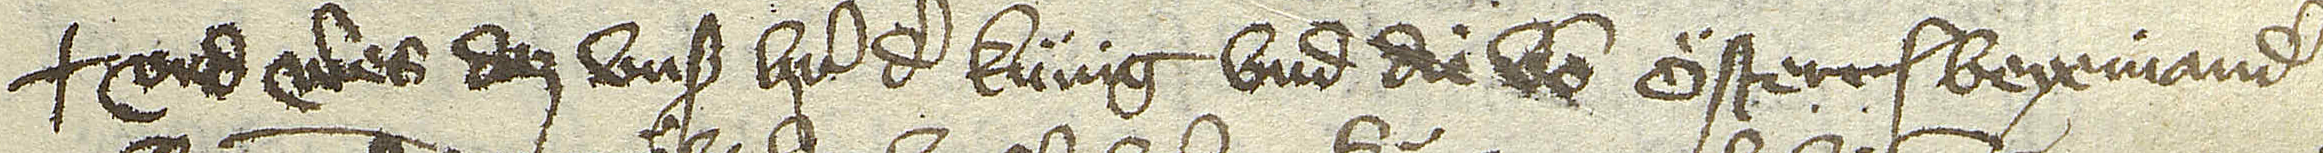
vnd w*es daʒ vnſ* hr* d* Künig vnd die vo* Öſterr* beyeinand*
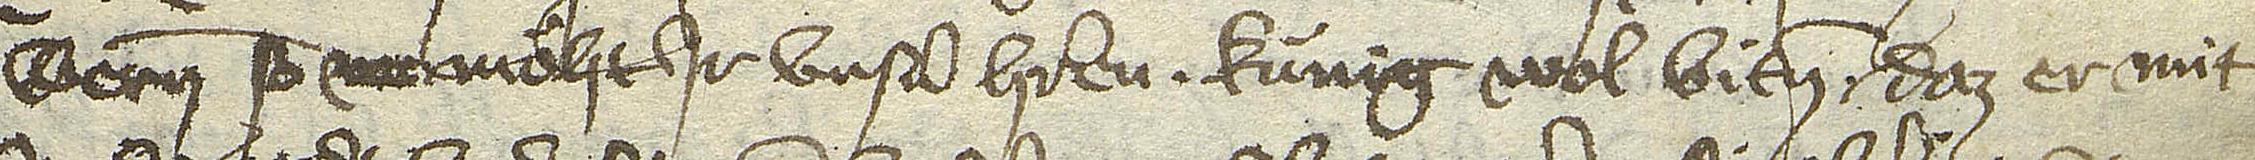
wern* ſo we möht Ir vnſn* hr*en . künig wol bitn* / daʒ er mit
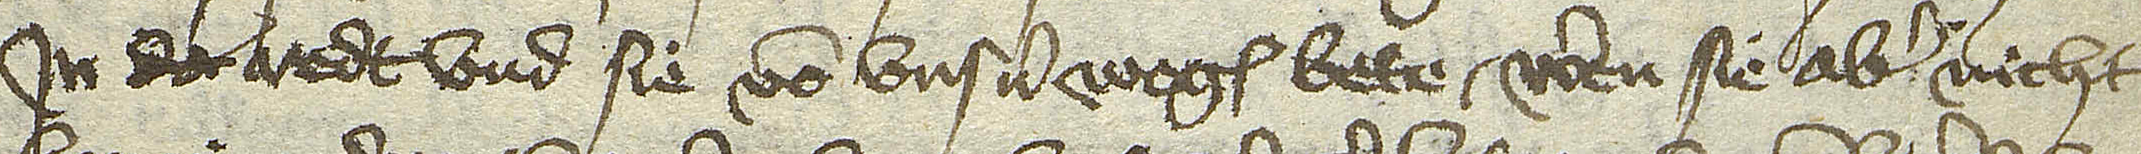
In do redt vnd ſie vo* vnſn* weg* bete / w*en ſie ab* nicht
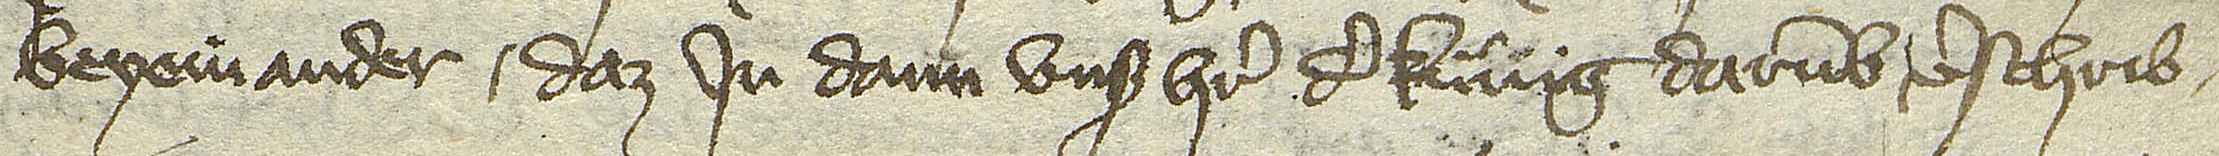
beyeinander / daʒ In dan vnſ* hr* d* künig darub* v*ſchrib /
